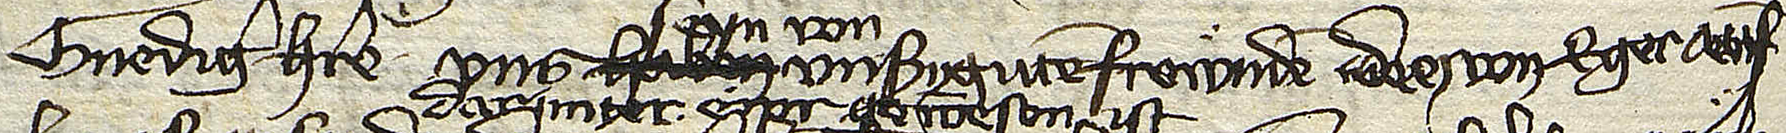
Gnedig* h*re vns haben vnſ*n gute* frewnde* den von Eger auf*
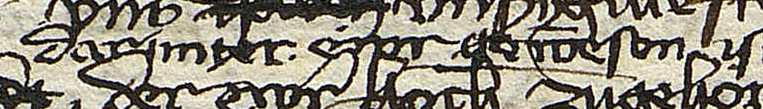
darunter einer geweſen iſt
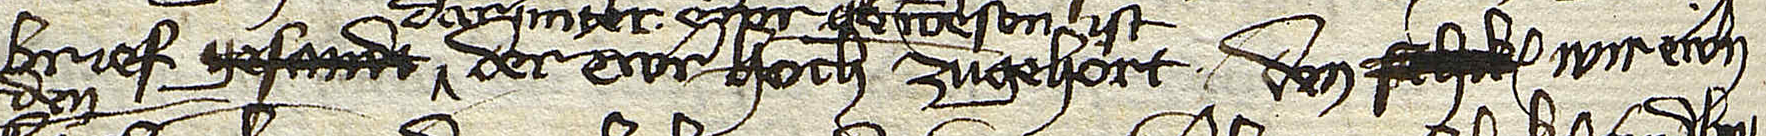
brief geſandt der ewr* hoch* ʒugehört . / Den ſchik* wir ewn*
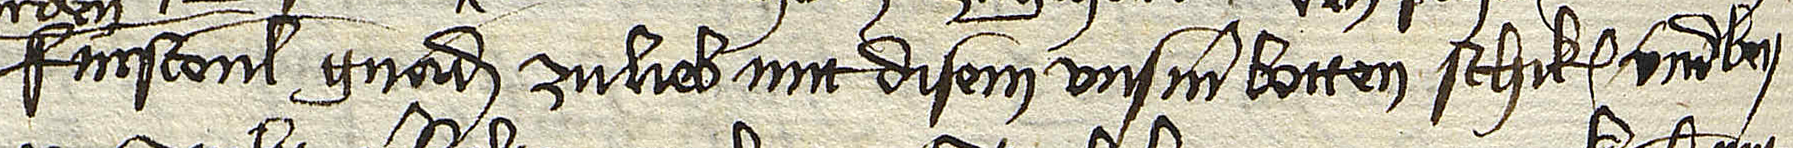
fürſtenl* gnad* ʒulieb mit diſem vnſ*m botten ſchik* / vnd bey
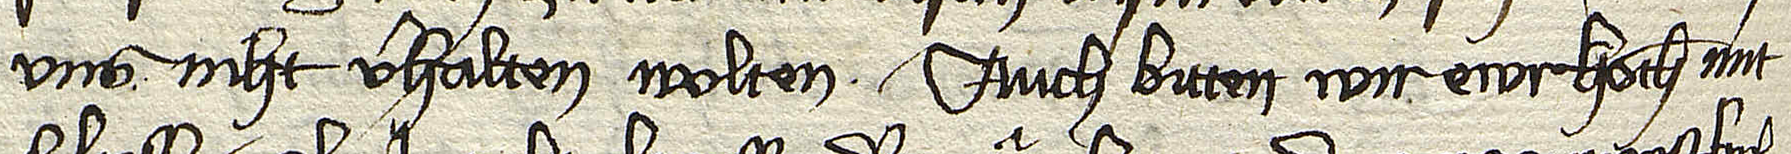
vns niht v*halten wolten . / Auch bitten wir ewr hoch* mit
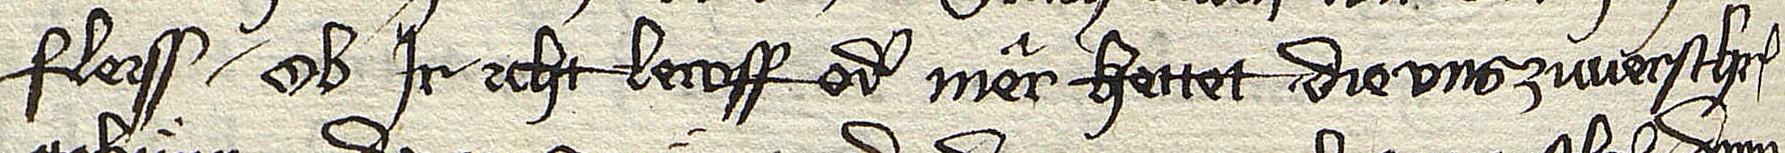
fleiſſ / Ob Ir icht lewff od* mër hettet / die vns ʒuuerſchr*
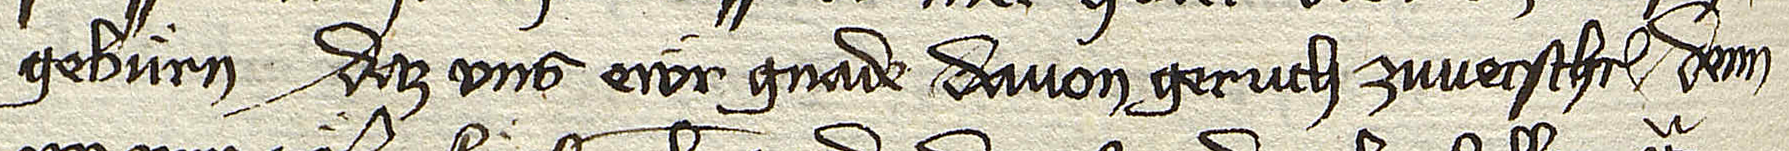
gebürn / daʒ vns ewr gnade / dauon geruch ʒuuerſchr* / denn
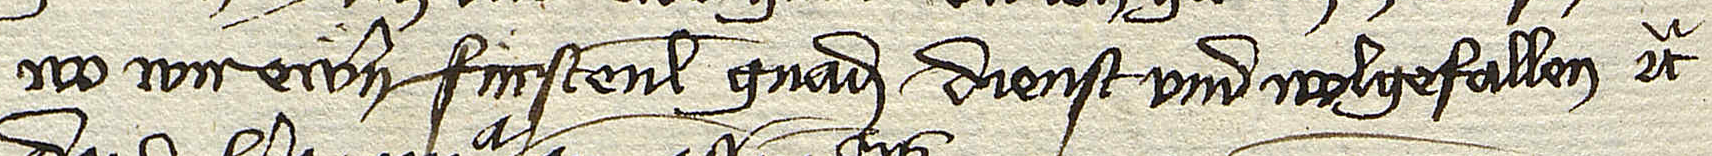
wo wir ew*n fürſtenl* gnad* / dienſt vnd wolgefallen ec*
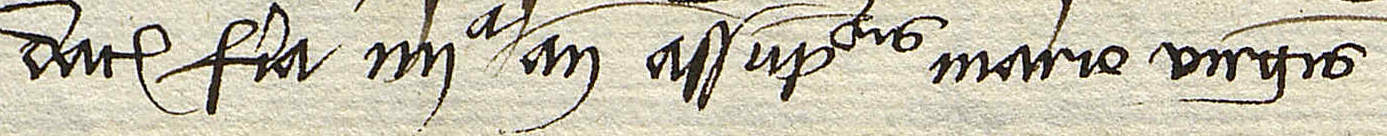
Dat* fia* iiii* an* aſſu*p* marie virgis*
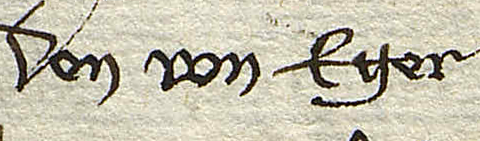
Den von Eger
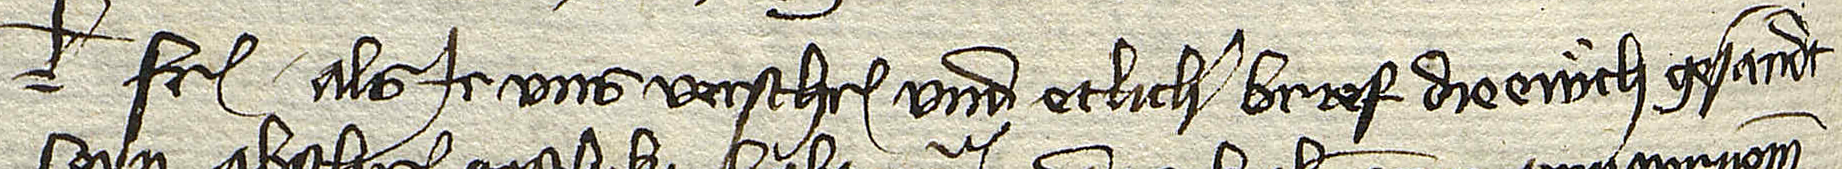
L* fr* / als Ir vns verſchr* vnd etlich* brief die ewch geſandt
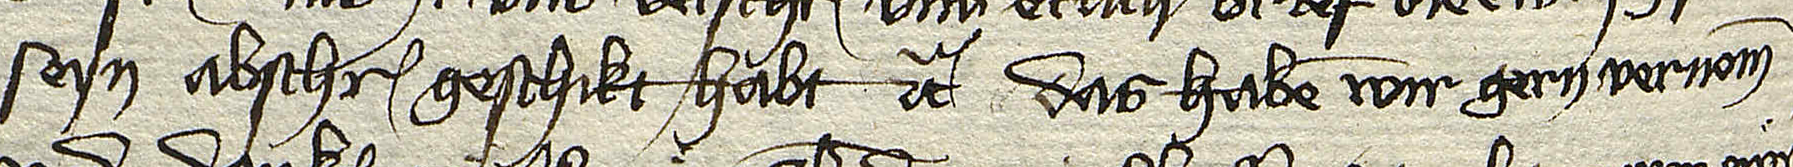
ſeyn abſchr* geſchikt habt ec* das habe* wir gern vernom*
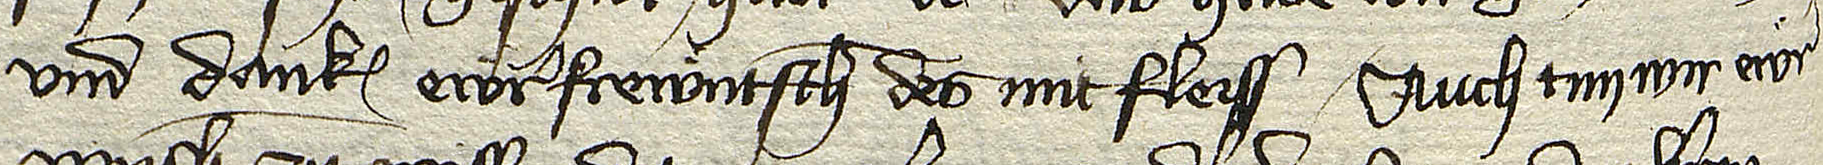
vnd dank* ewr* frewntſch* des mit fleiſſ / Auch tun wir ewr*
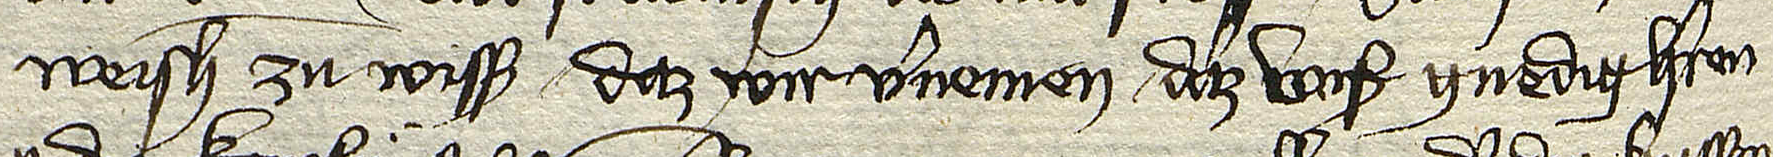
weiſh* ʒu wiſſ* / daʒ wir v*nemen / daʒ Vnſ* gnedig h*ren
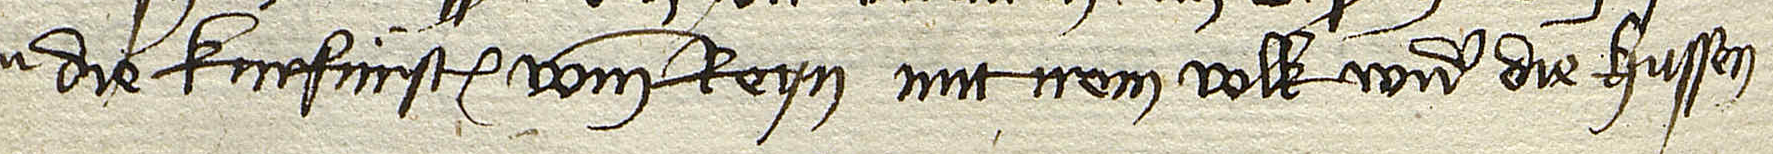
~ die kurfürſt* vom* Reyn mit irem volk wid* die huſſen
